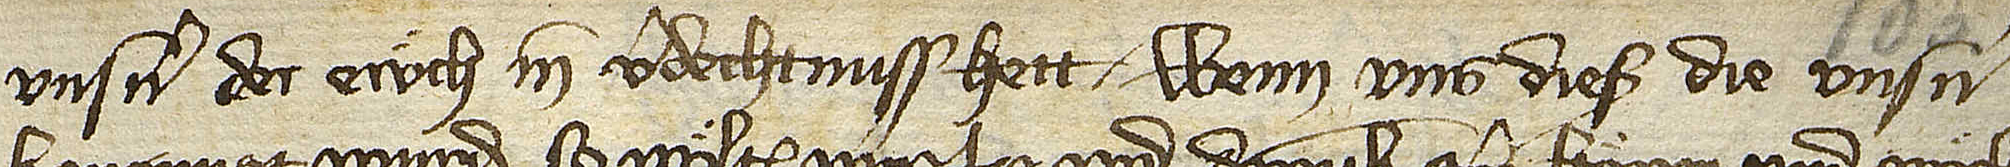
vnſn* der eẅch in v*dechtnuſſ hett / Wenn vns dieſ* die vnſn*
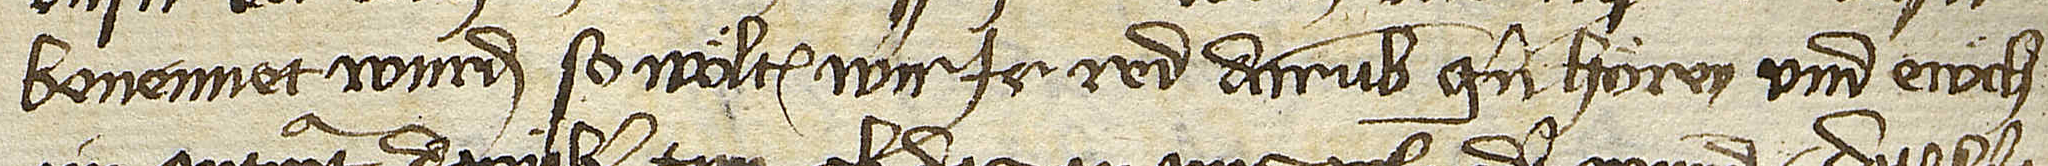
benennet wurd* ſo wölt* wir Ir red darub* g*n hören vnd eẅch
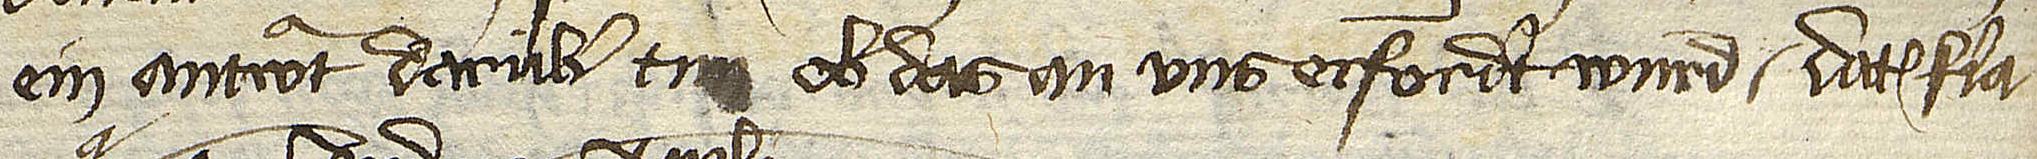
ein antw*t darüb* tun ob das an vns erford*t wurd / Dat* fi*a
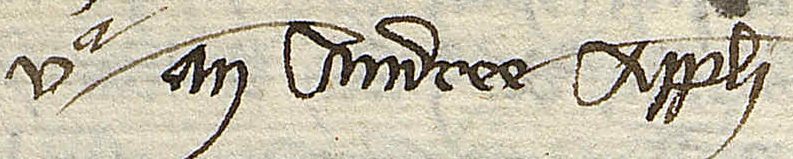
v* an* Andree Appli*
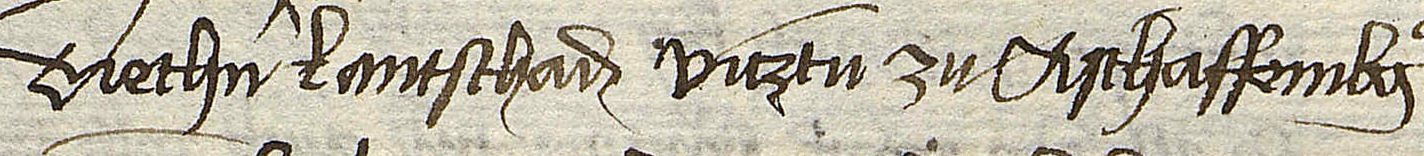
Diethn* lantſchad* vicʒtu* ʒu Aſchaffemb*g
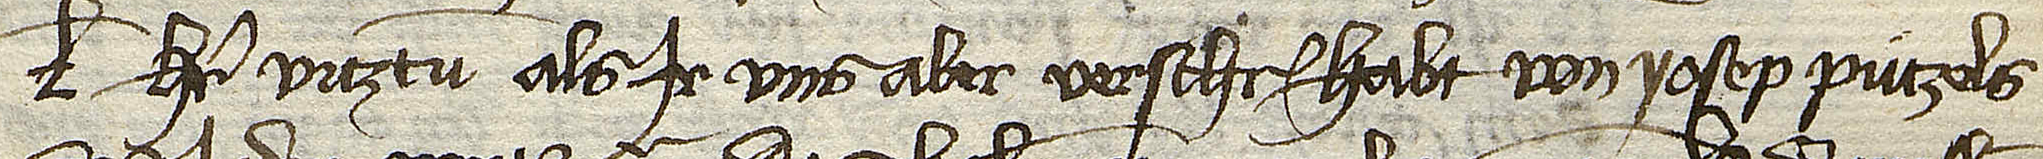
L* Hr* vicʒtu* als Ir vns aber verſchr* habt von yoſep pücʒels
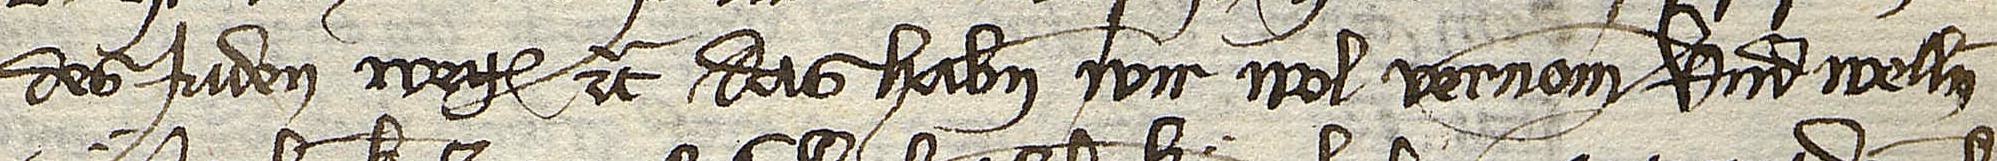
des Iuden weg* ec* / Das habn* wir wol vernom* / Vnd welln*
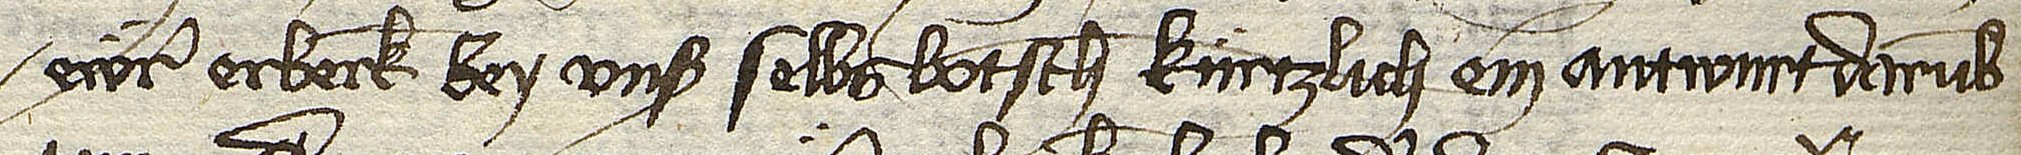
eẅr* erberk* bey vnſ* ſelbs botſch* kürcʒlich ein antwurt darub*
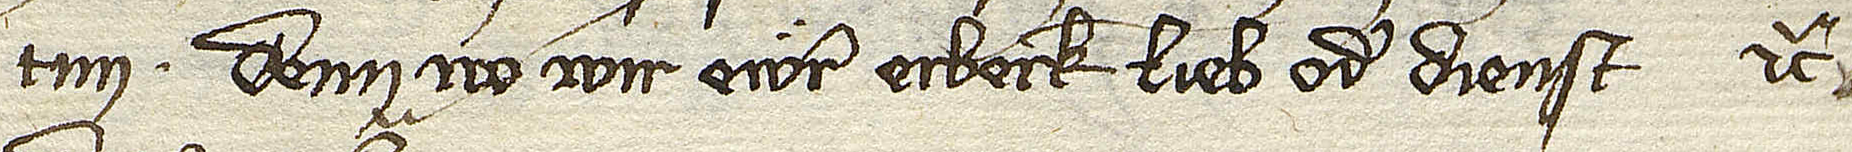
tun . Denn wo wir eẅr* erberk* lieb od* dienſt ec*
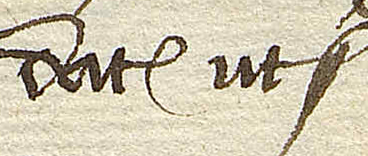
Dat* ut ſ*
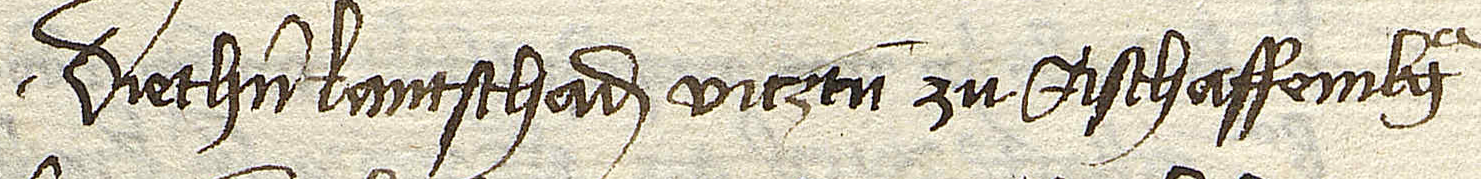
Diethn* lantſchad* vicʒtu* ʒu Aſchaffemb*g
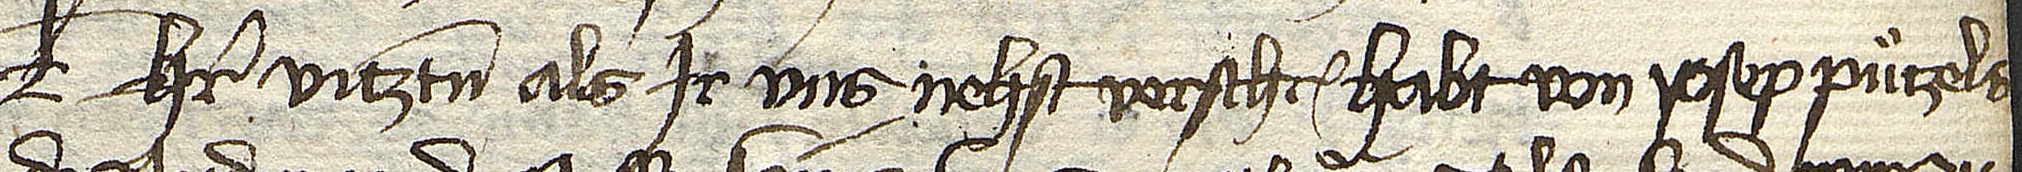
L* Hr* vicʒtu* als Ir vns nehſt verſchr* habt von yoſep pücʒels
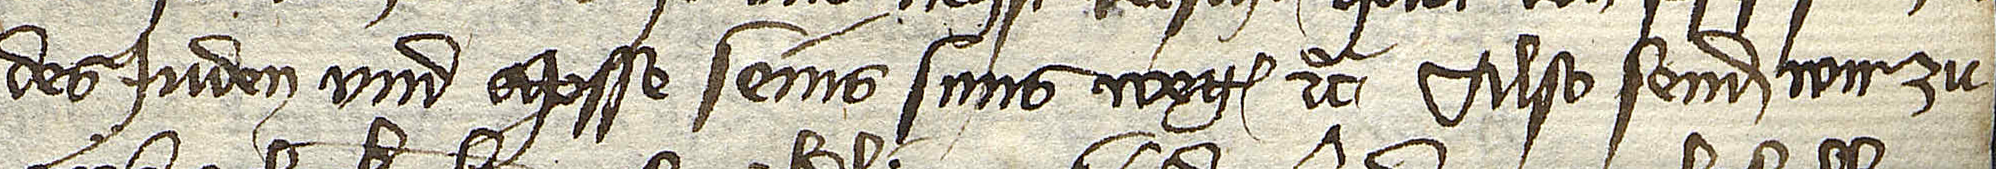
des Iuden vnd Moſſe ſeins ſuns weg* ec* Alſo ſend* wir ʒu
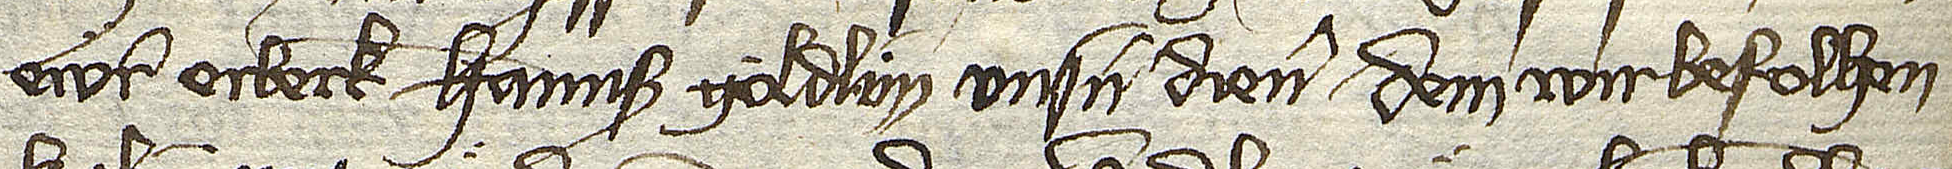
eẅr* erberk* hannſ* göldlein vnſn* dien* / Dem wir befolhen
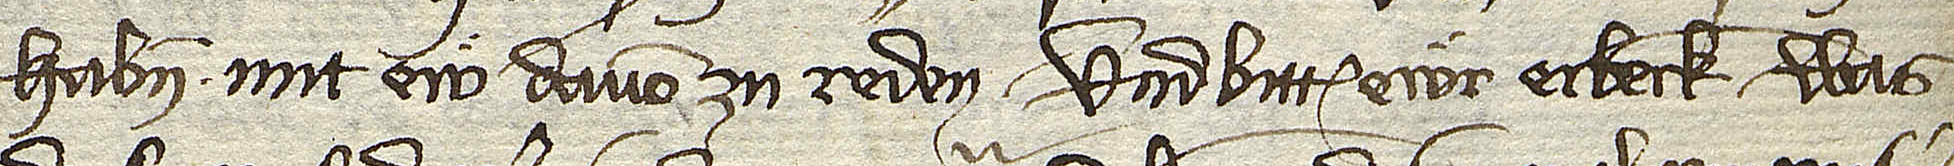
habn* . mit eẅ dauo* ʒu reden / Vnd bitt* eẅr erberk* / Was
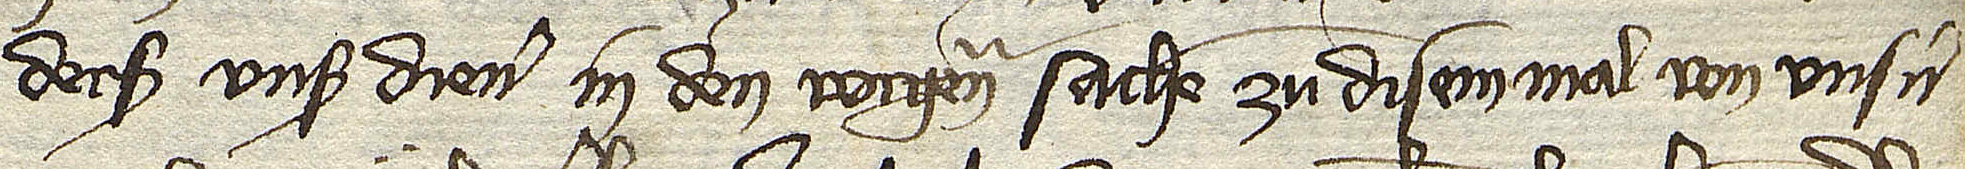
derſ* vnſ* dien* in den vorgen* ſache* ʒu diſem mal von vnſn*
